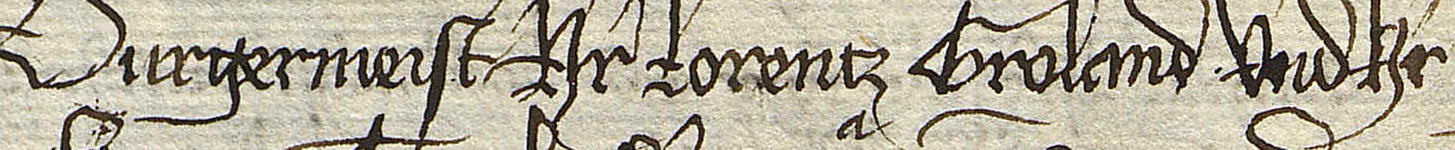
Burgermeiſt* Hr* Lorencʒ Groland Vnd Hr*
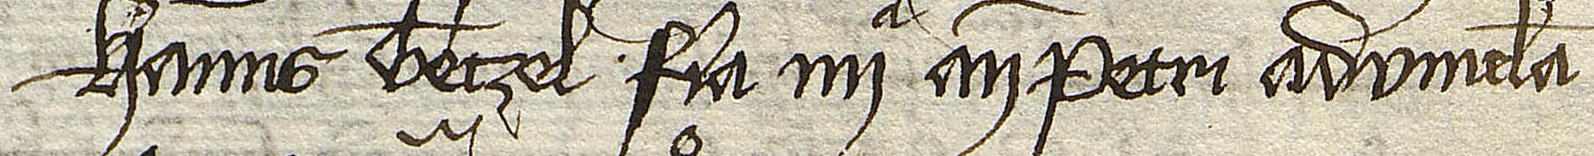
Hanns Tecʒel fi*a iiii* an* Petri advinc*la
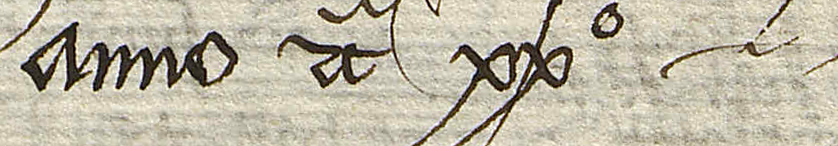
anno ec* xx* /
